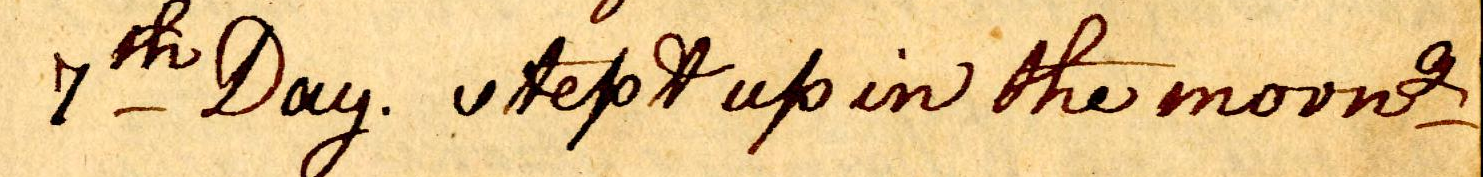7^th Day. stept up in the morn^g
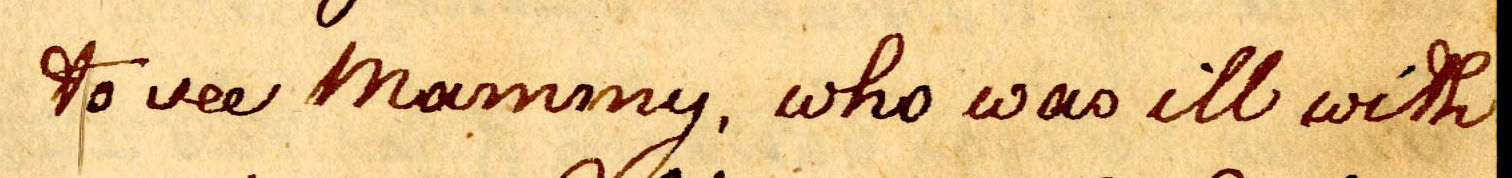to see Mammy, who was ill with
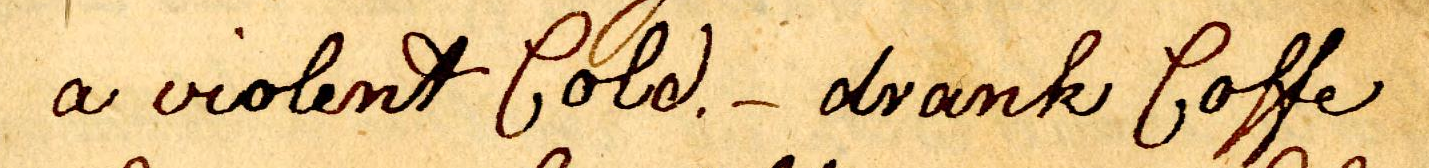a violent Cold.- drank Coffe
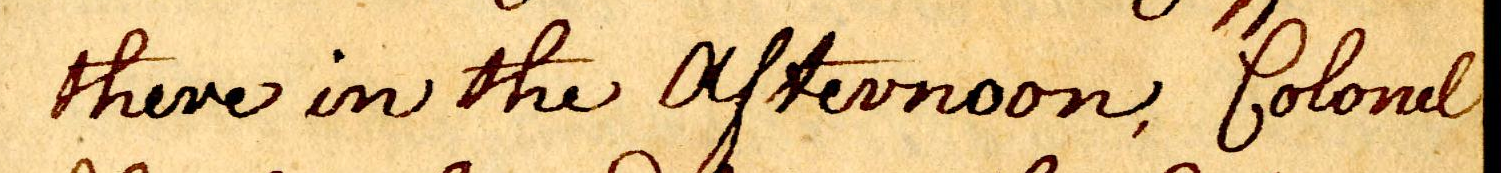there in the Afternoon, Colonel
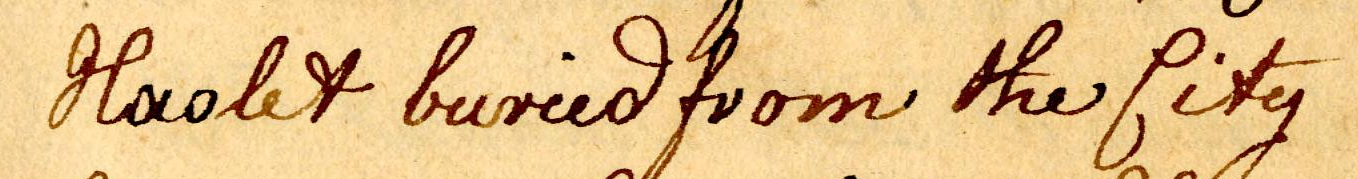Haslet buried from the City
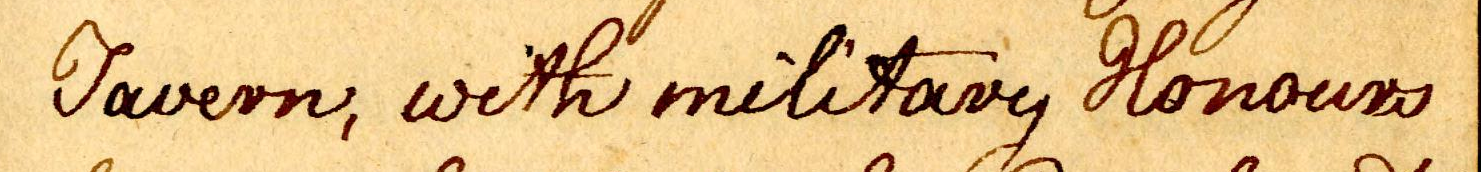Tavern, with military Honours
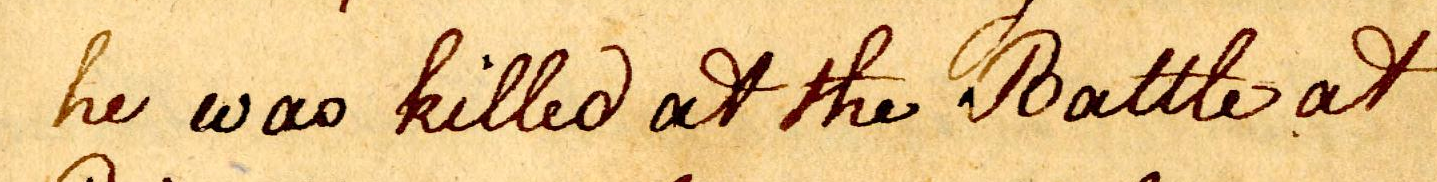he was killed at the Battle at
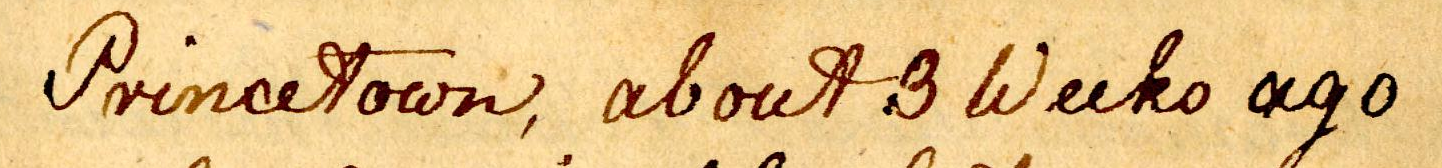Princetown, about 3 Weeks ago
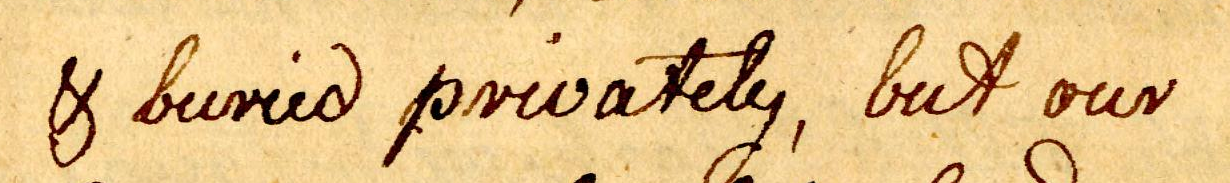& buried privately, but our
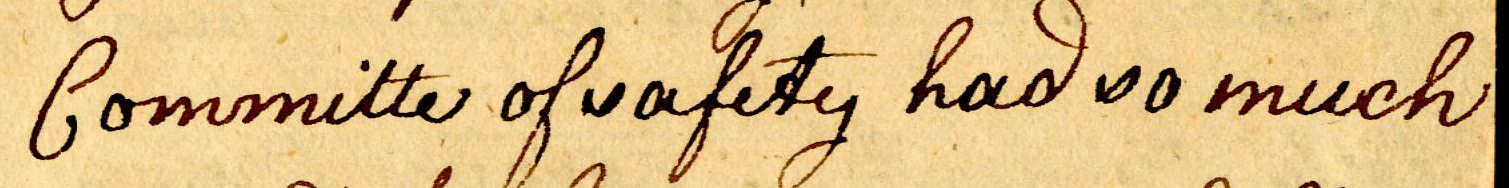Committe of safety had so much
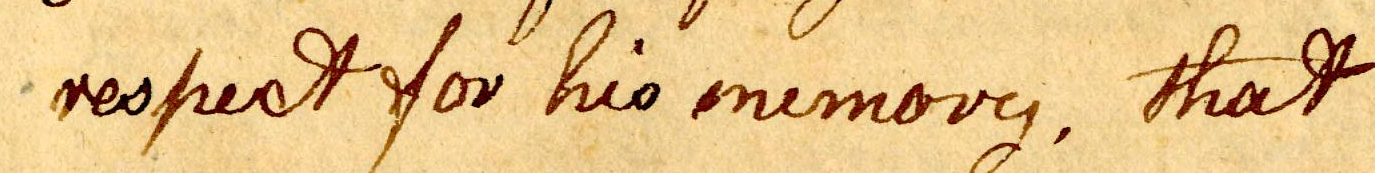respect for his memory, that
